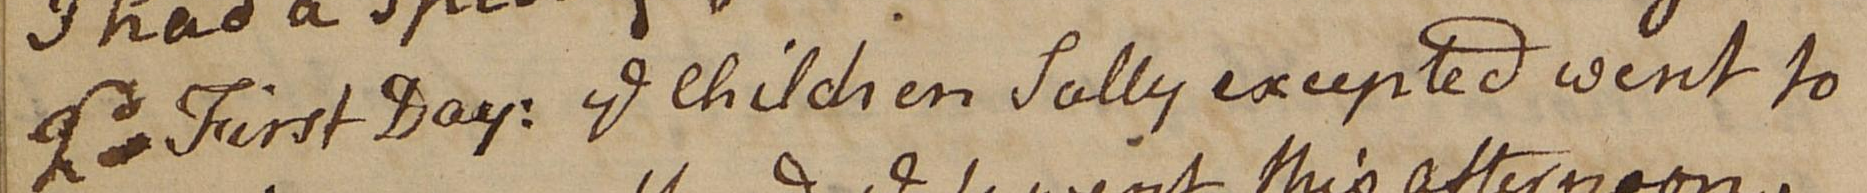2^d. First Day: y^e Children Sally excepted went to
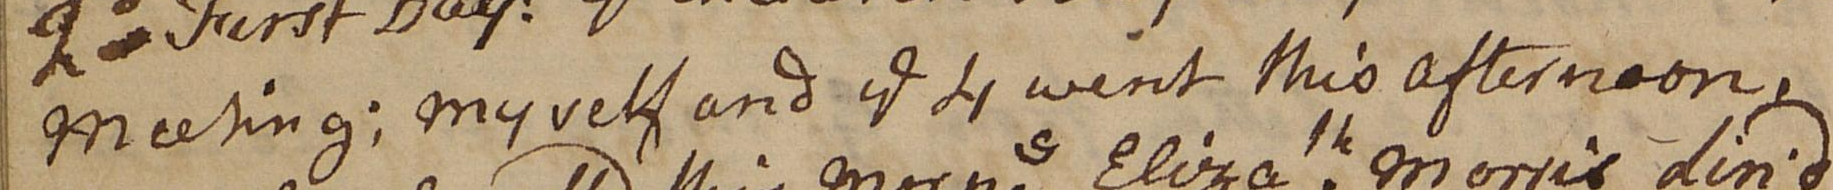Meeting; myself and y^e 4 went this afternoon,
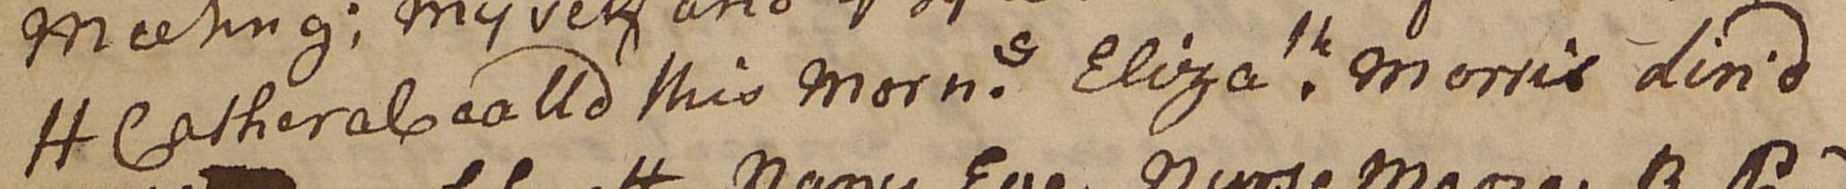H Catheral calld this morn^g. Eliza^th. Morris din'd
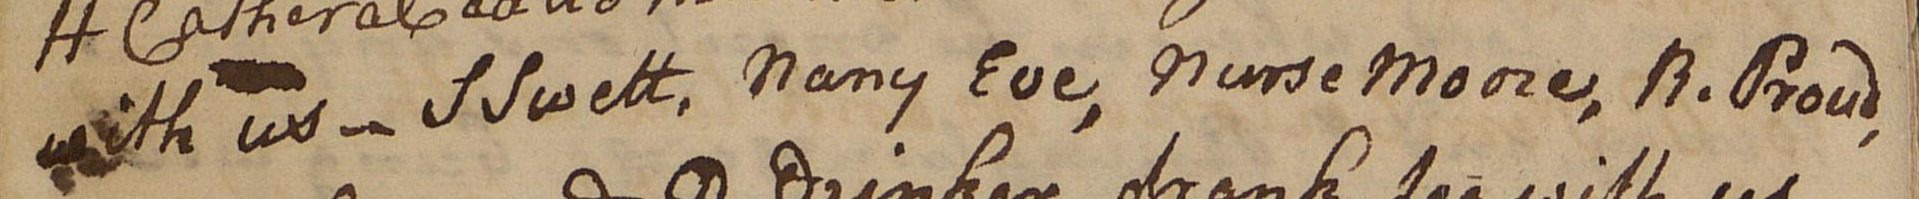with us- S Swett, Nany Eve, Nurse Moore, R. Proud,
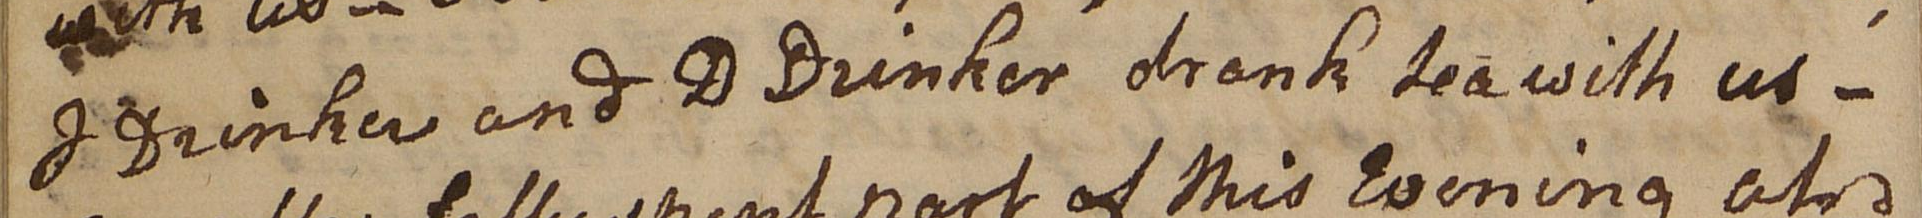J Drinker and D Drinker drank tea with us-
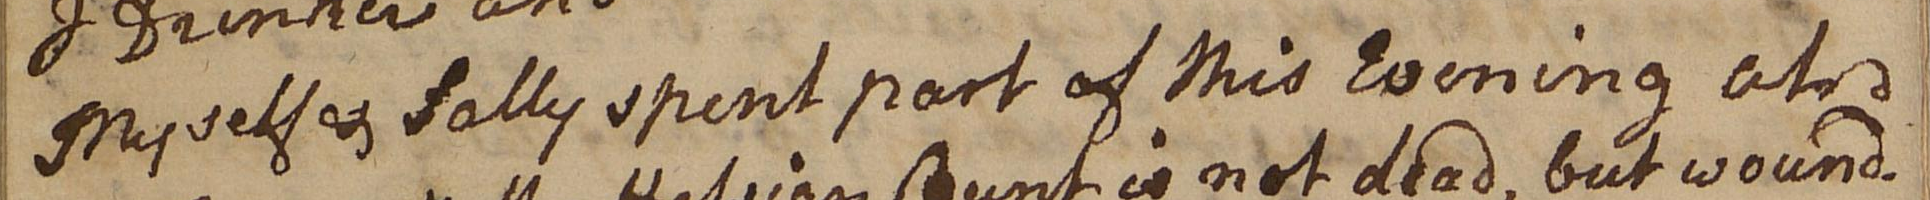Myself & Sally spent part of this Evening at
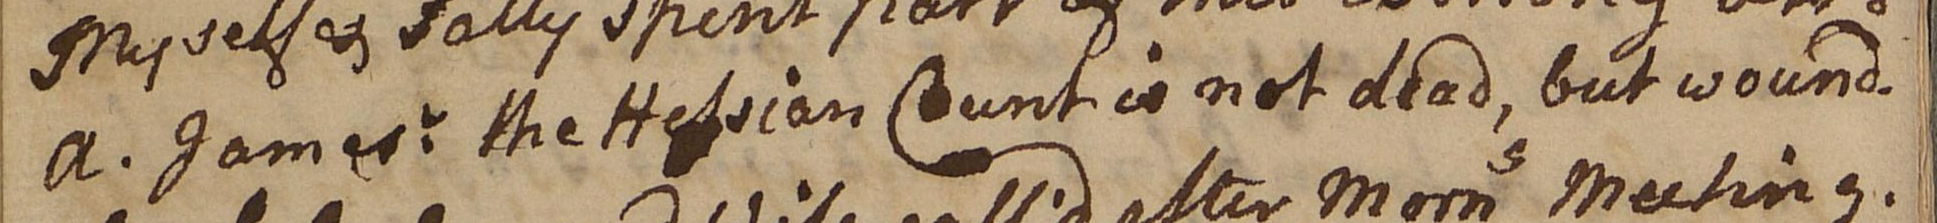A. James^s. the Hessian Count is not dead, but wound.
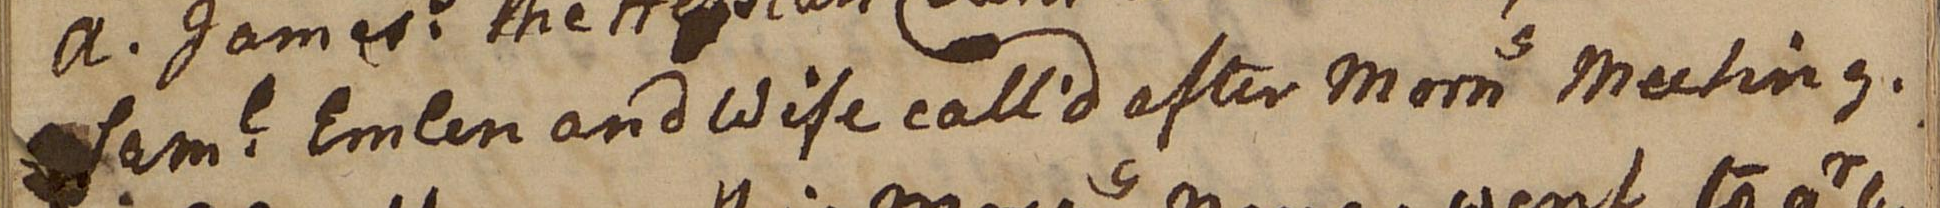Sam^l. Emlen and Wife call'd after morn^g meeting.
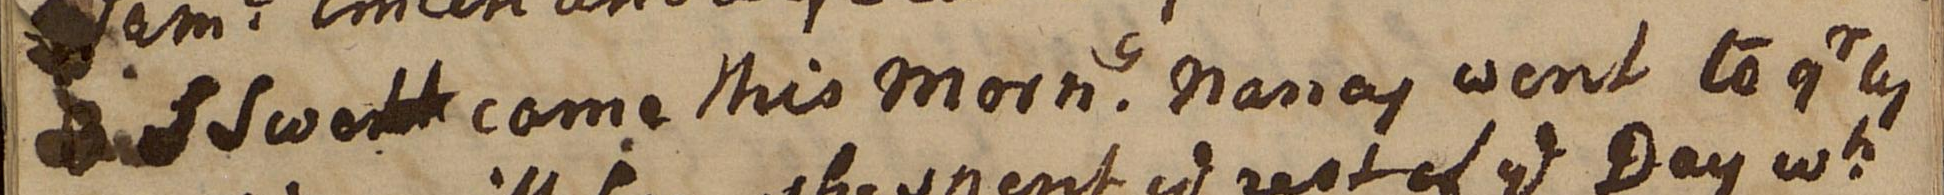3. S Swett came this morn^g. Nancy went to q^rly
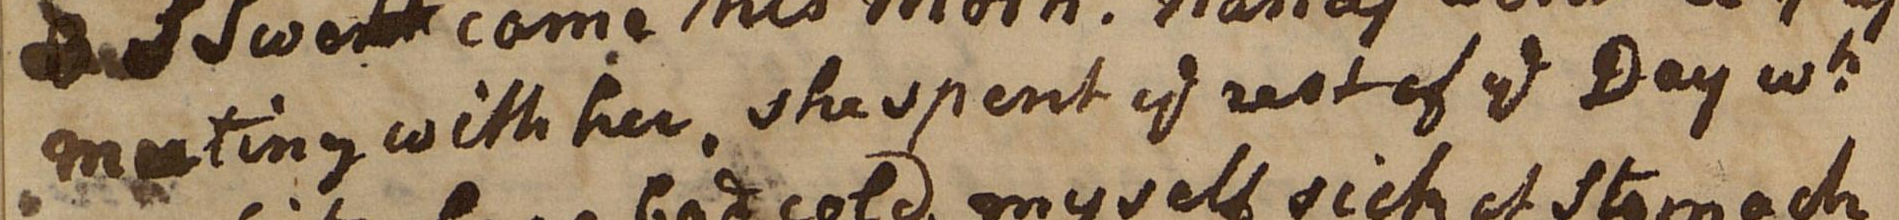m[ee]ting with her, she spent y^e rest of y^e Day w^h.
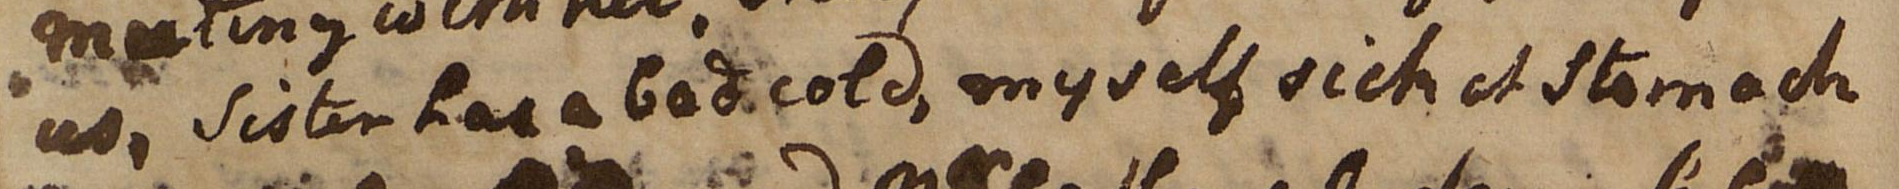us, Sister has a bad cold, myself sick at Stomach
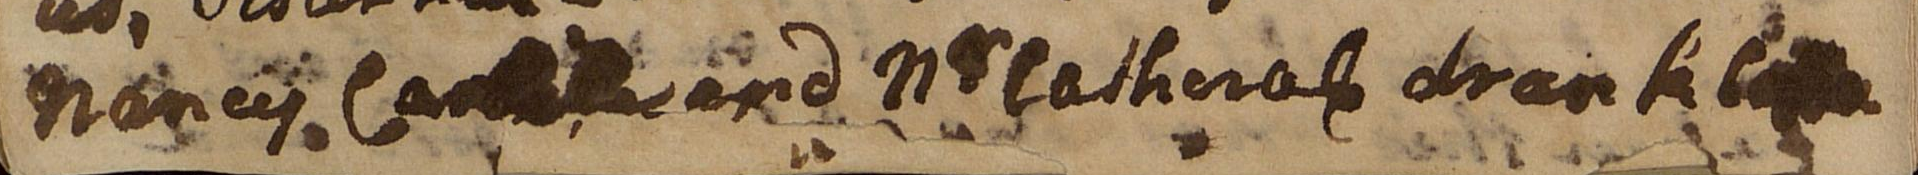Nancy Carlile and N^r Catheral drank Coffe
